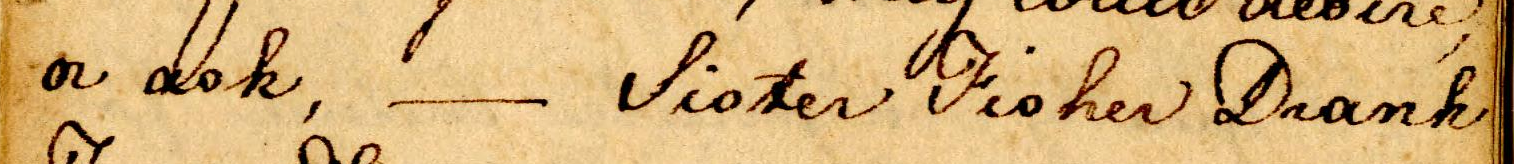or ask.- Sister Fisher Drank
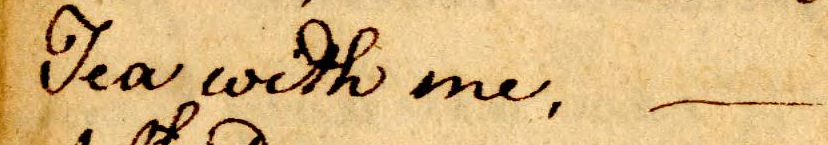Tea with me.-
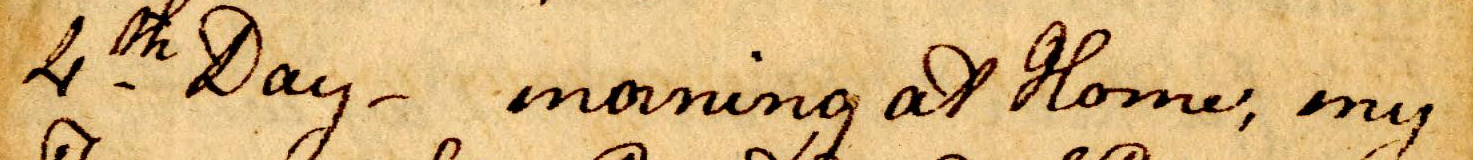4^th Day- morning at Home, my
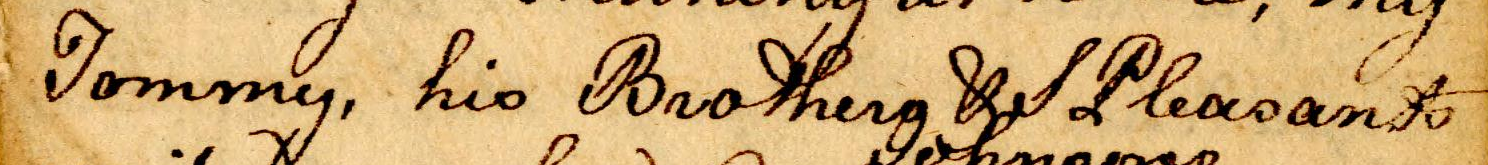Tommy, his Brother & S Pleasants
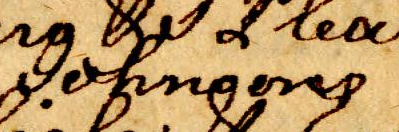Johnsons
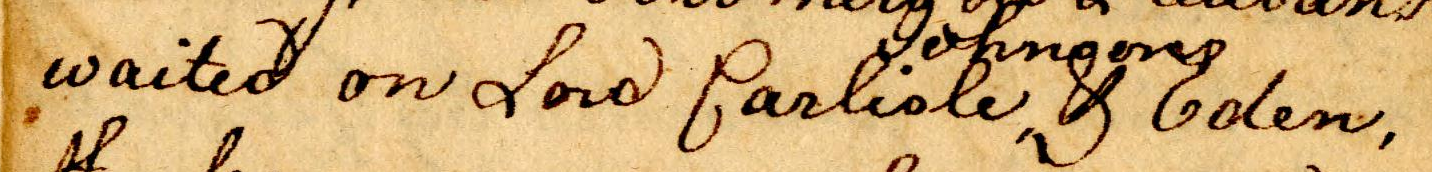waited on Lord Carlisle, & Eden,
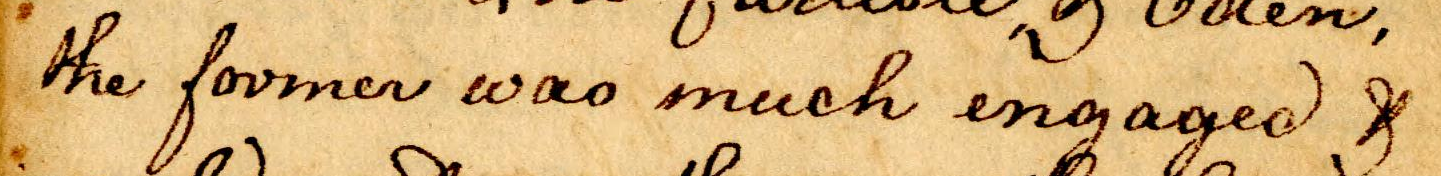the former was much engaged &
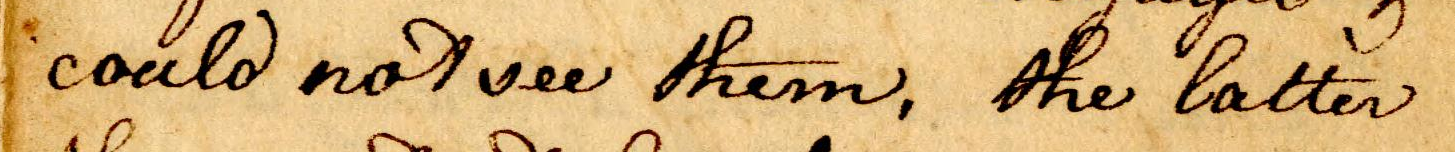could not see them, the latter
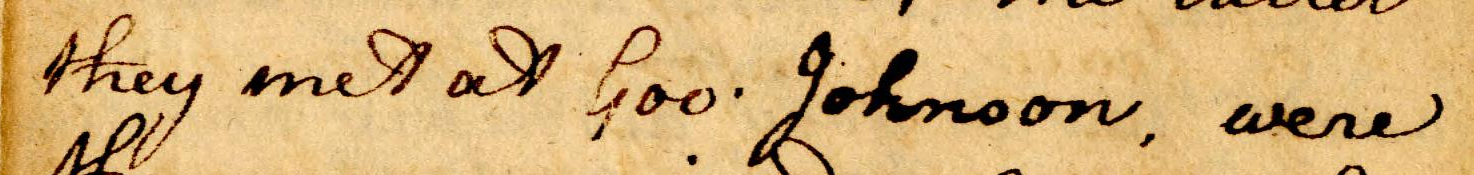they met at Gov. Johnson, were
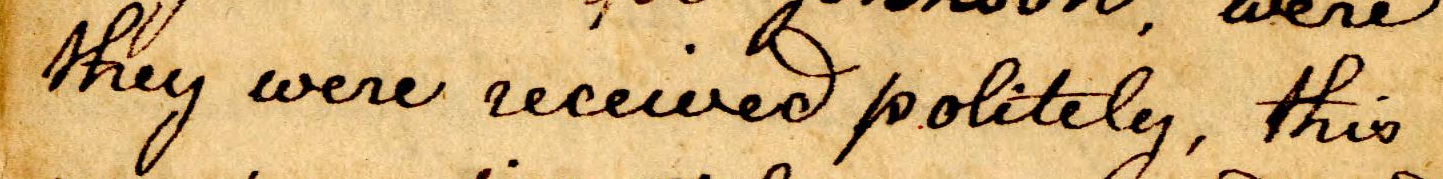they were received politely, this
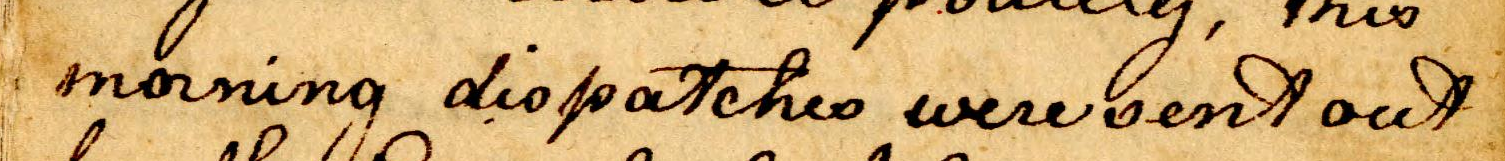morning dispatches were sent out
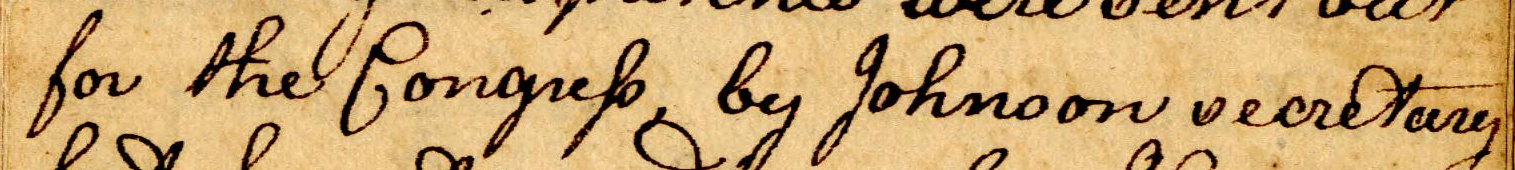for the Congress, by Johnson secretary
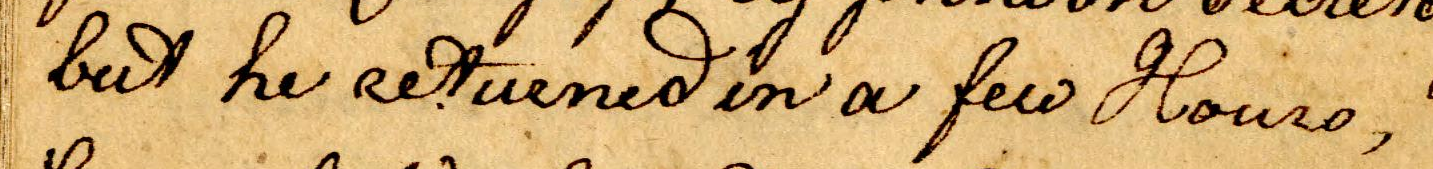but he returned in a few Hours
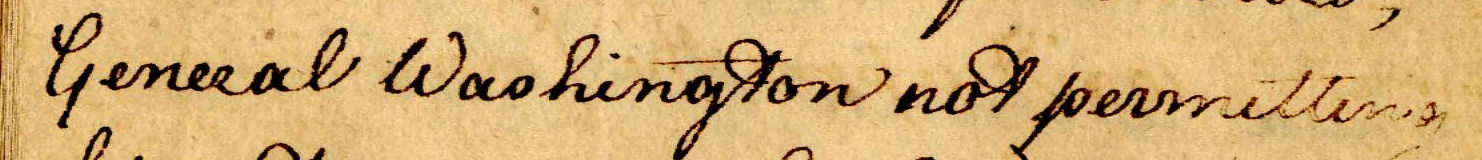General Washington not permitting
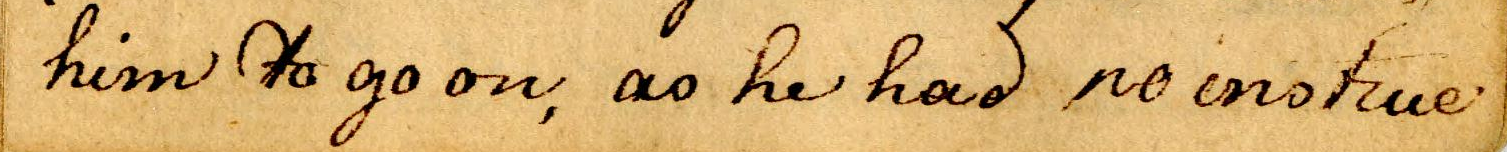him to go on, as he had no instiue
